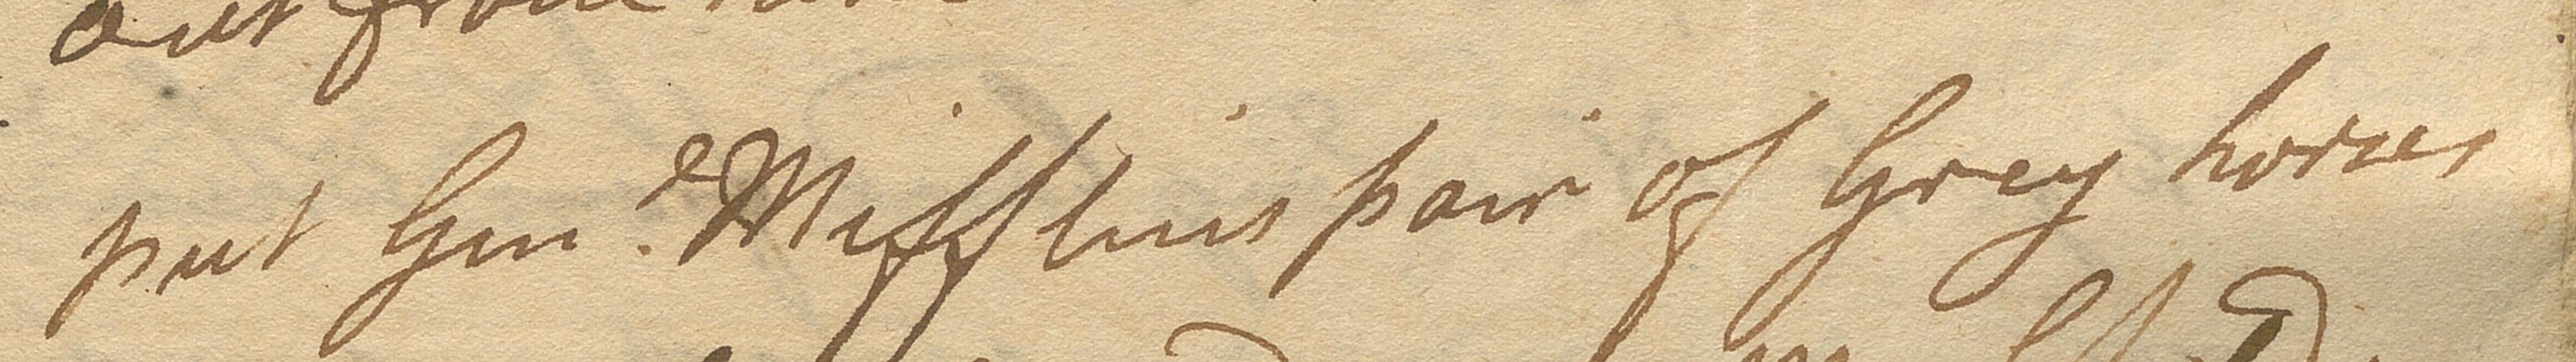put Gen^l. Mifflins pair of Grey horses
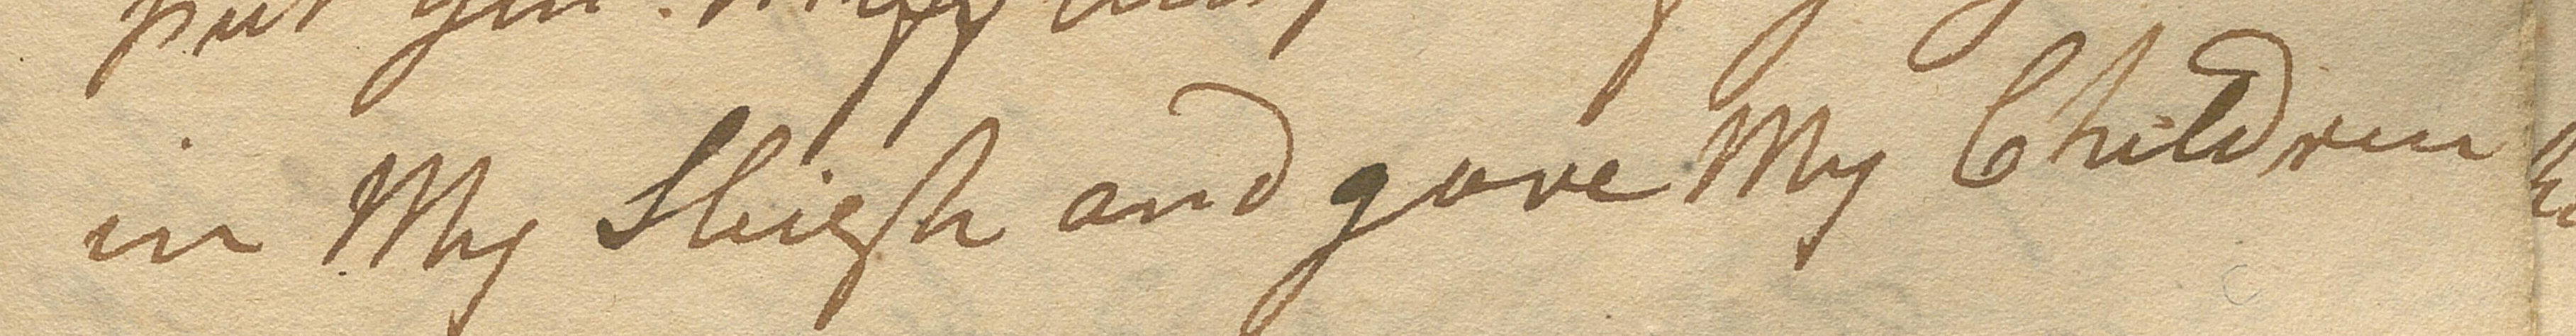in My Sleigh and gave My Children
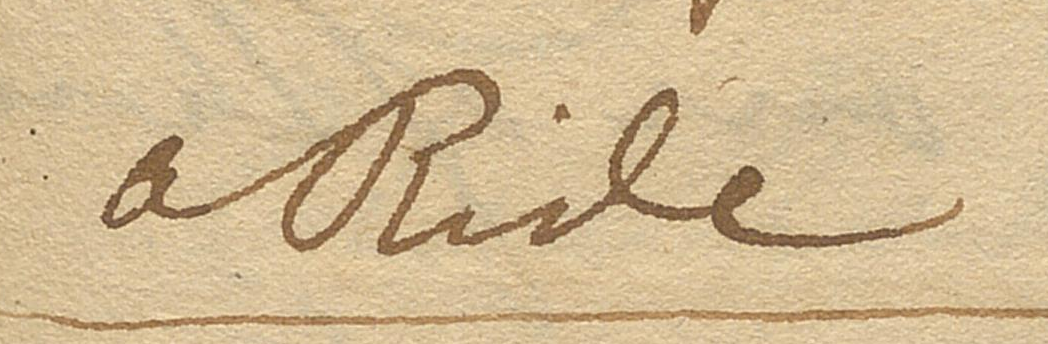a Ride
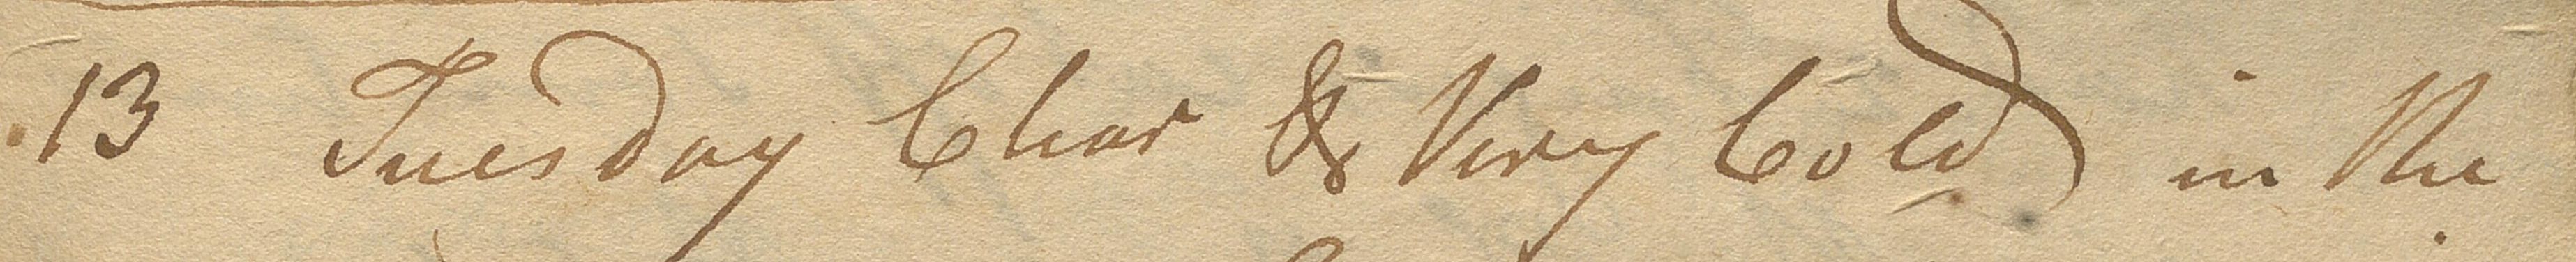13 Tuesday Clear & Very Cold in the
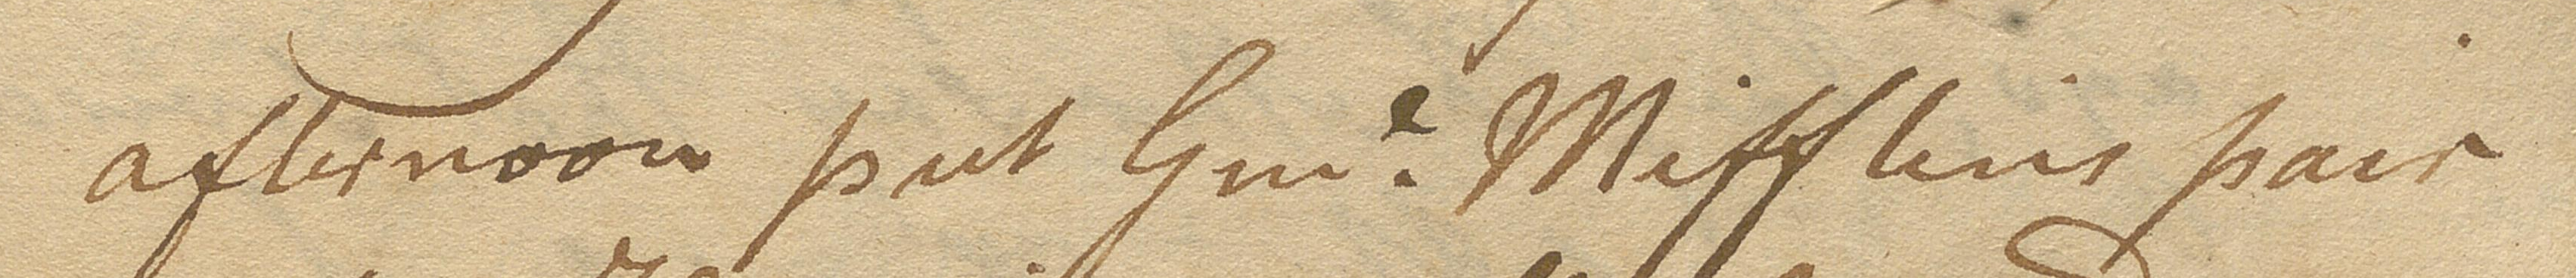afternoon put Gen^l. Mifflins pair
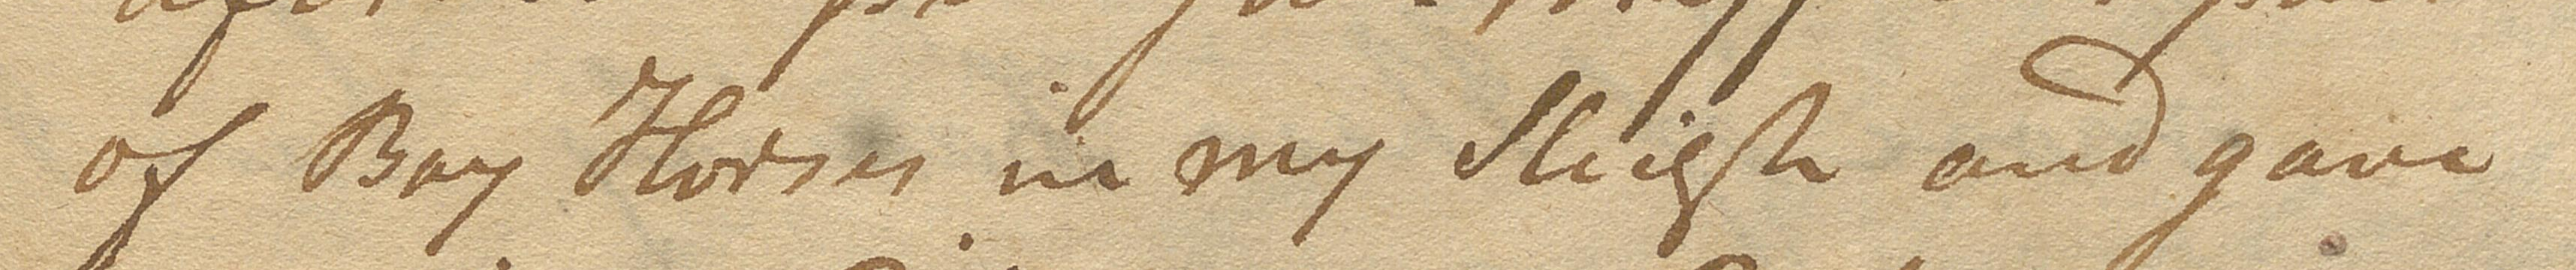of Bay Horses in my Sleigh and gave
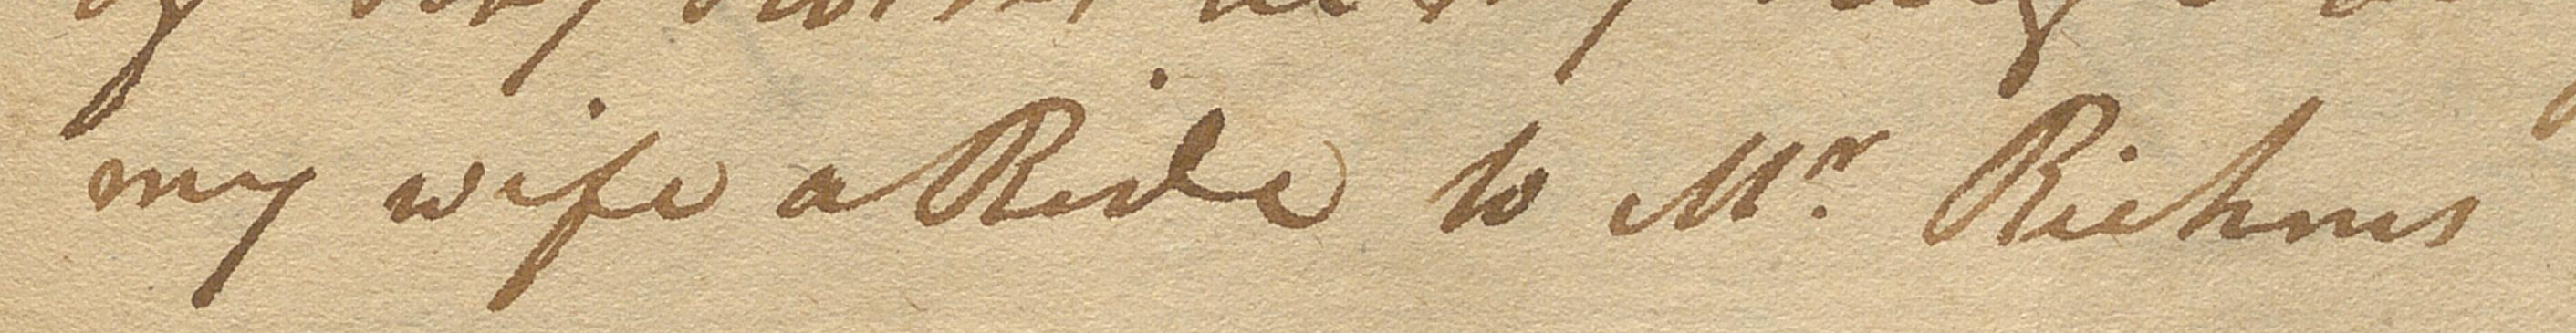my wife a Ride to M^r. Richms
